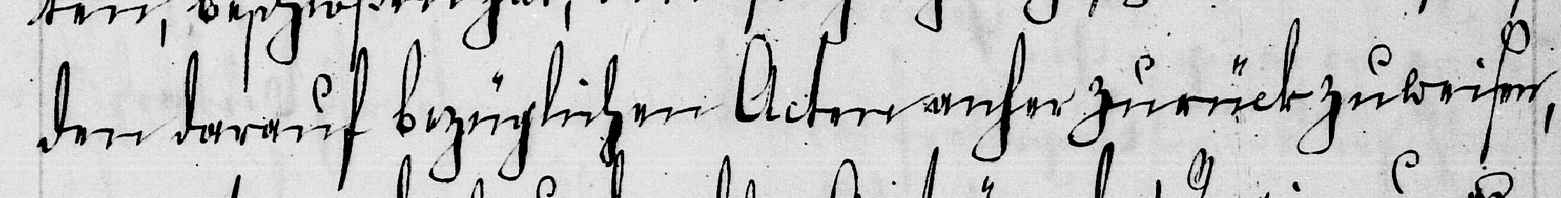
den darauf bezüglichen Acten anher zurückzuweisen,
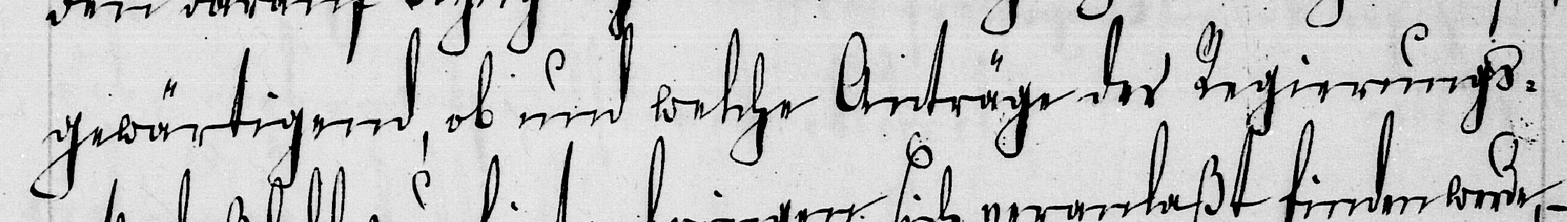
gewärtigend, ob und welche Anträge der Regierungsr¬
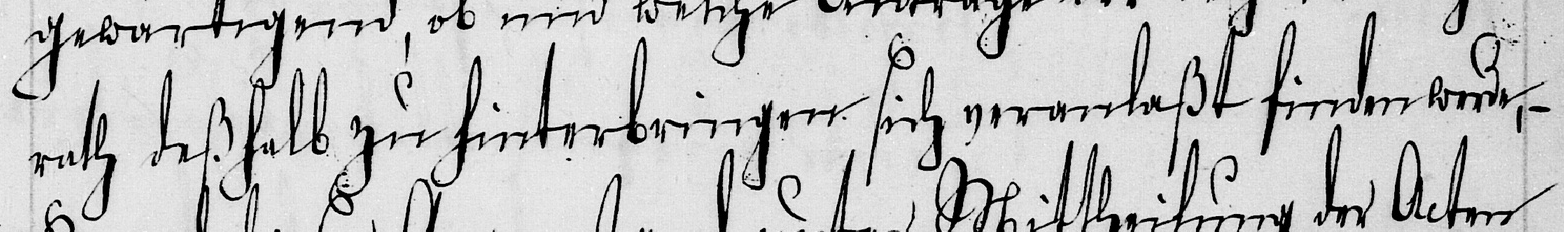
ath deßhalb zu hinterbringen sich veranlaßt finden werde,
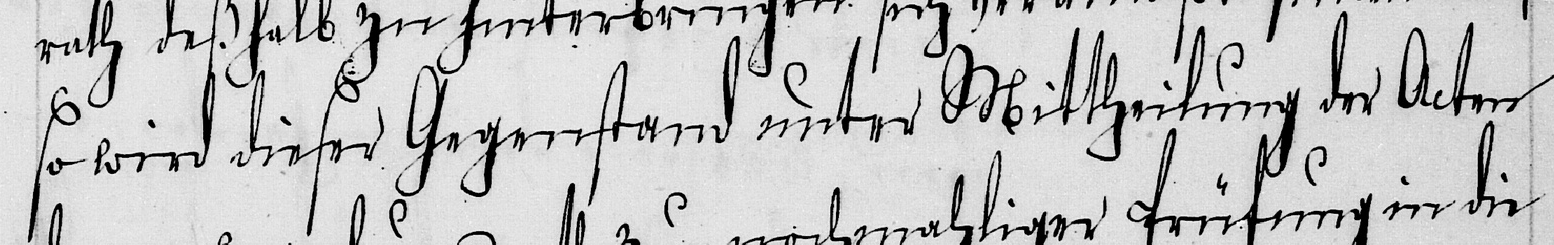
so wird dieser Gegenstand unter Mittheilung der Acten
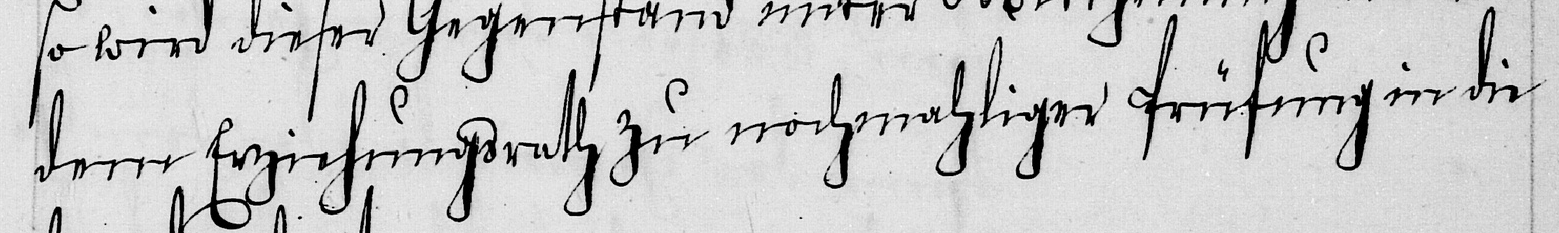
dem Erziehungsrathe zu nochmaliger Prüfung in die
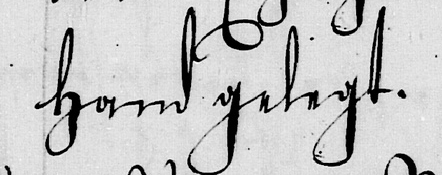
Hand gelegt.
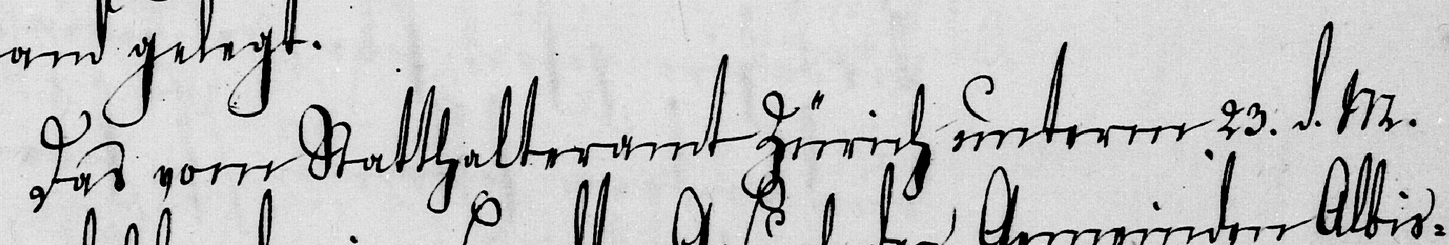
Das vom Statthalteramt Zürich unterm 23. d. M.
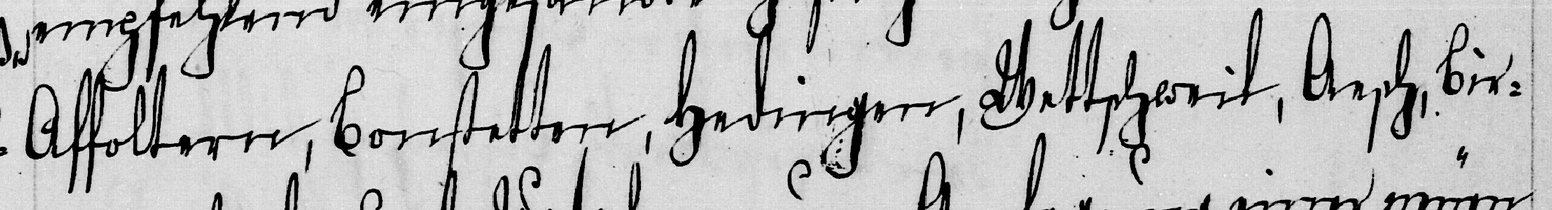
ffoltern, Bonstetten, Hedingen, Wettschweil, Aesch, Bi¬
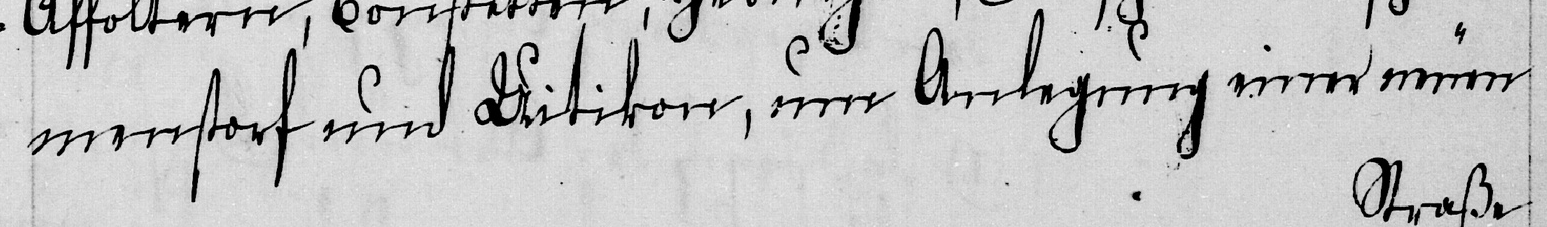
rmenstorf und Uitikon, um Anlegung einer neuen
